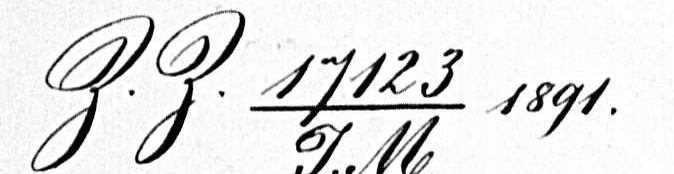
Z. Z. 17123 1891.
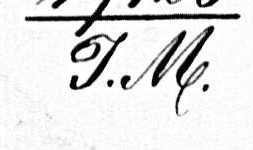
J. M.
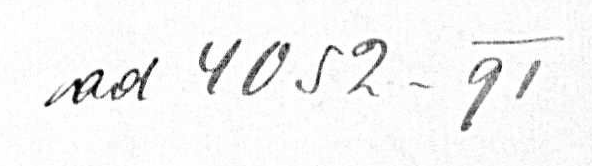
ad 4052 - 91
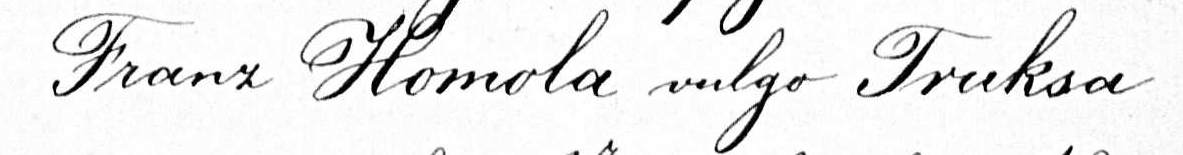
Franz Homola, vulgo Truksa,
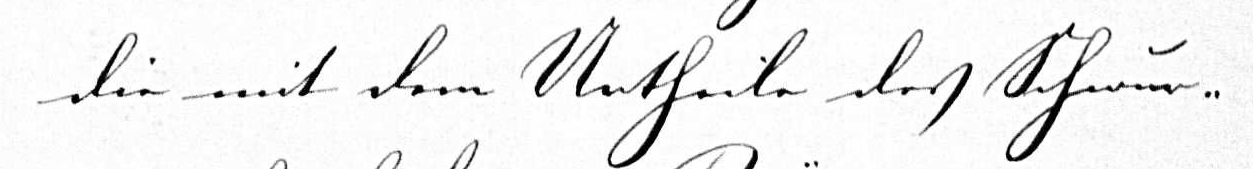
die mit dem Urtheile des Schwur¬
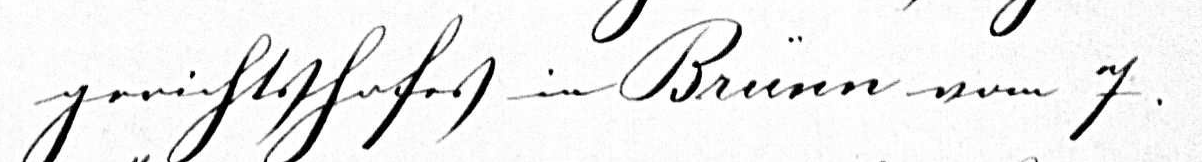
gerichtshofes in Brünn vom 7.
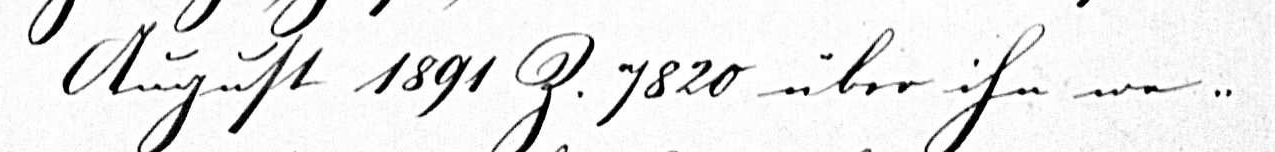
August 1891 Z. 7820 über ihn we¬
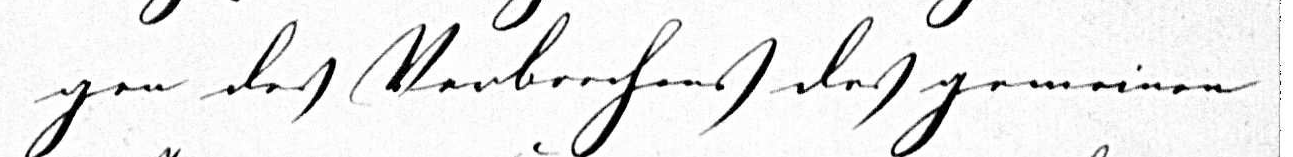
gen des Verbrechens des gemeinen
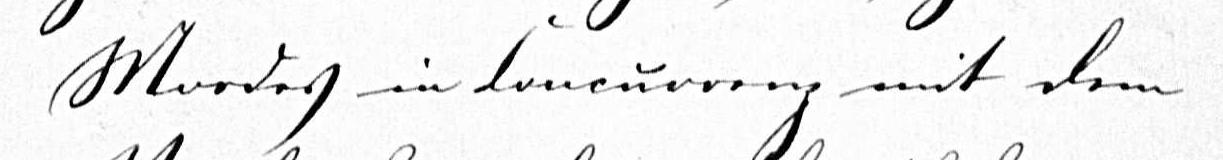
Mordes in Concurrenz mit dem
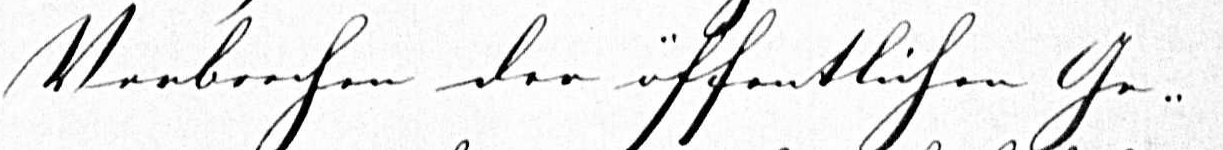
Verbrechen der öffentlichen Ge¬
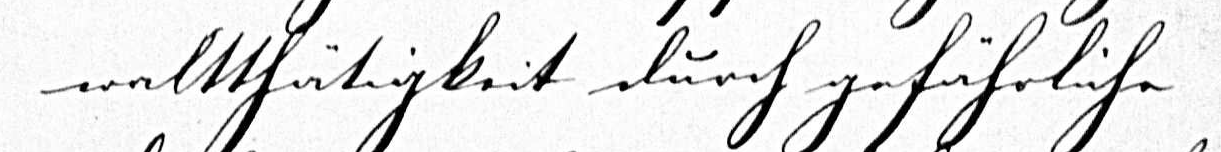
waltthätigkeit durch gefährliche
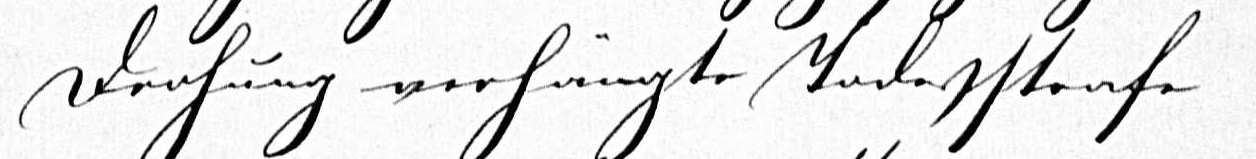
Drohung verhängte Todesstrafe
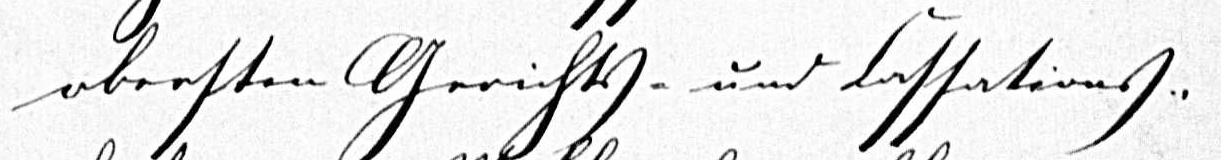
obersten Gerichtsund Cassations¬
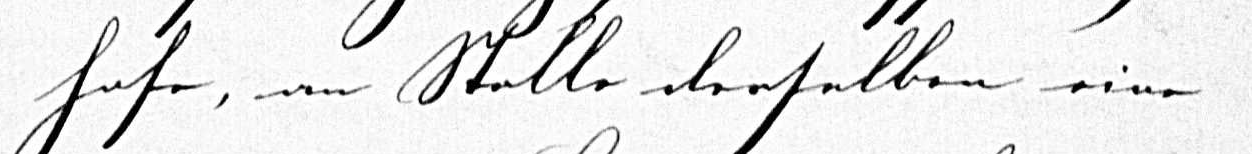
hofe an Stelle derselben eine
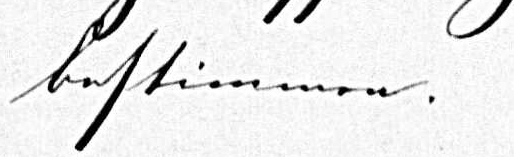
bestimmen.
